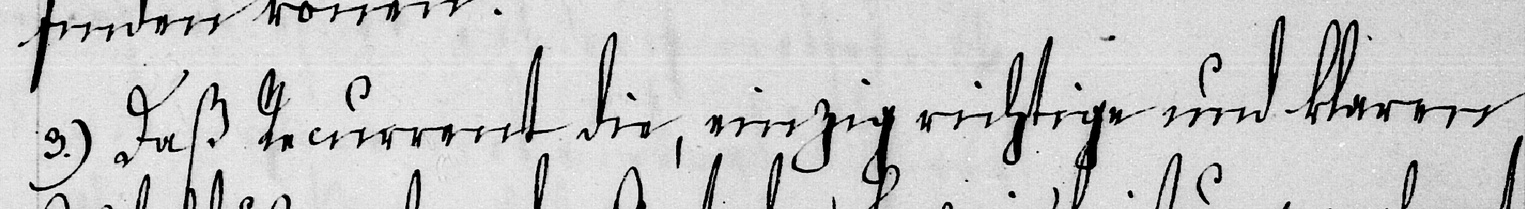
3.) Daß Recurrent die, einzig richtige und klaren
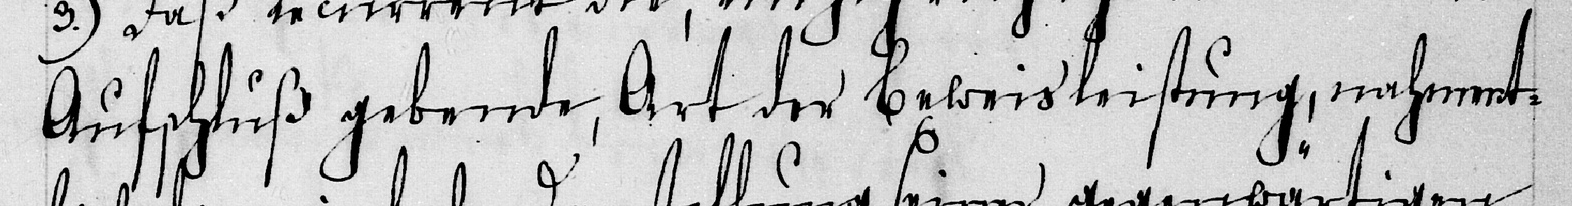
Aufschluß gebende, Art der Beweisleistung, nahment¬
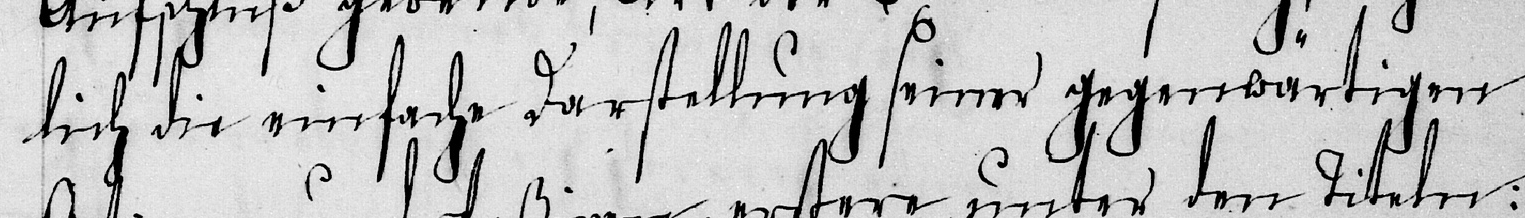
lich die einfache Darstellung seiner gegenwärtigen
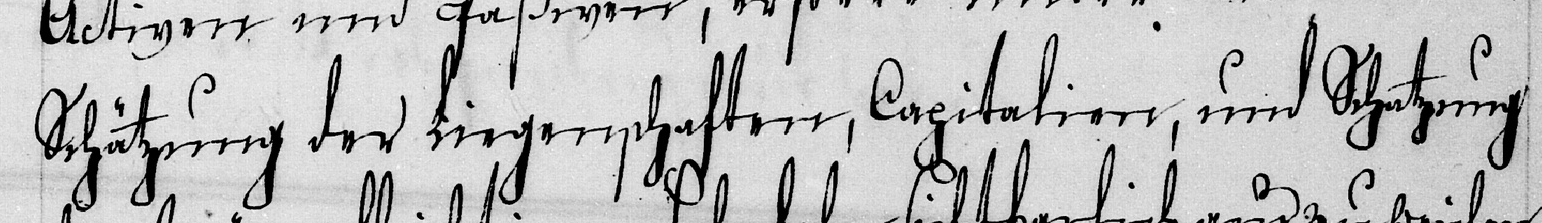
Schätzung der Liegenschaften, Capitalien, und Schatzung
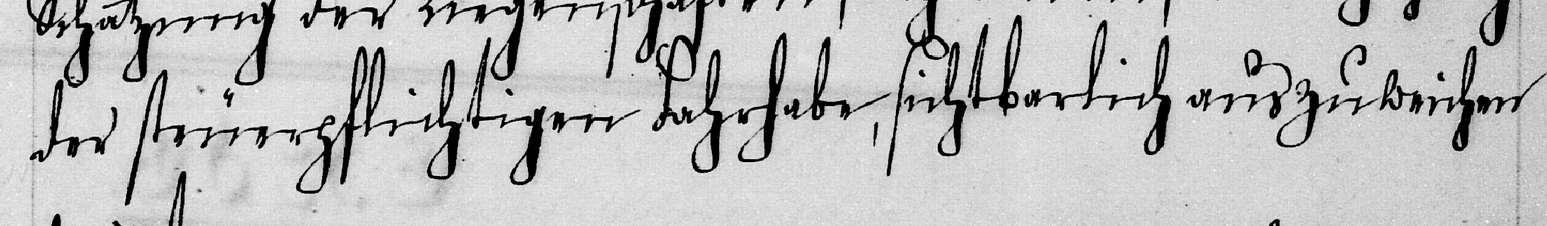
der steuerpflichtigen Fahrhabe, sichtbarlich auszuweichen
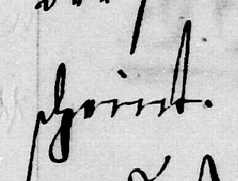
scheint.
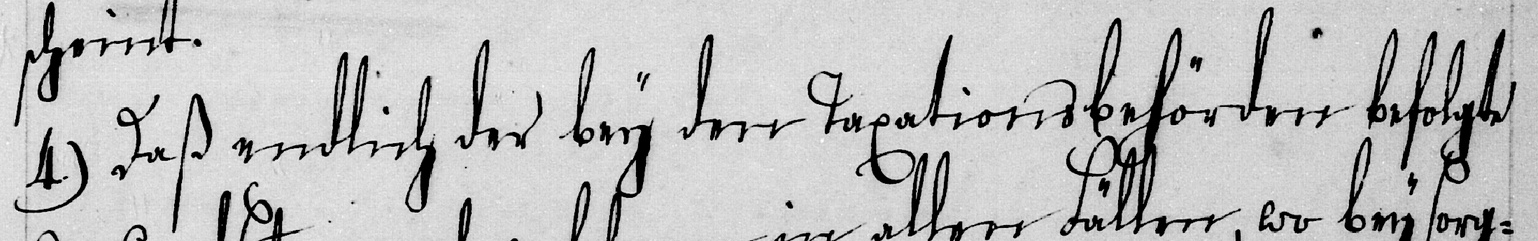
4.) Daß endlich der bey den Taxationsbehörden befolgte
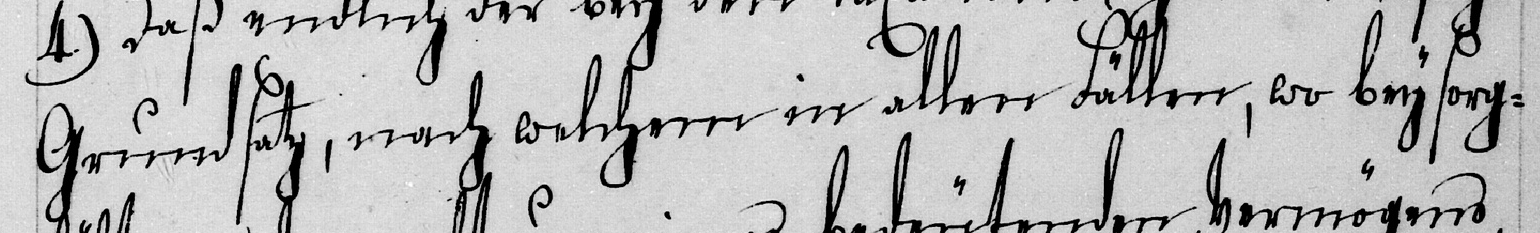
Grundsatz, nach welchem in allen Fällen, wo bey sor¬
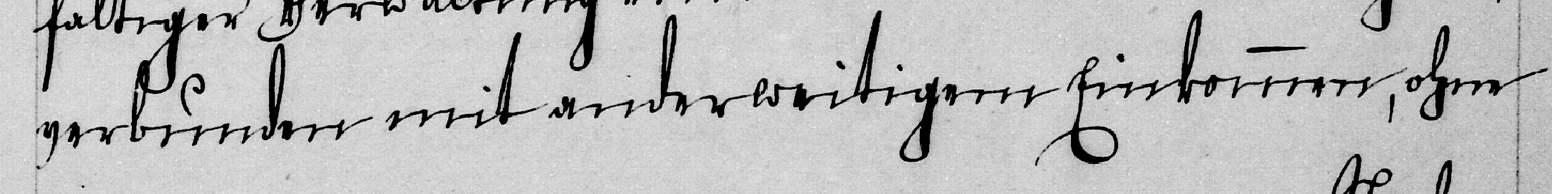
verbunden mit anderweitigem Einkommen, ohne
